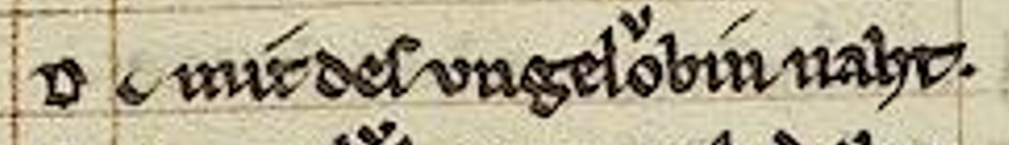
Daz mit deſ vngelo°vbin naht.
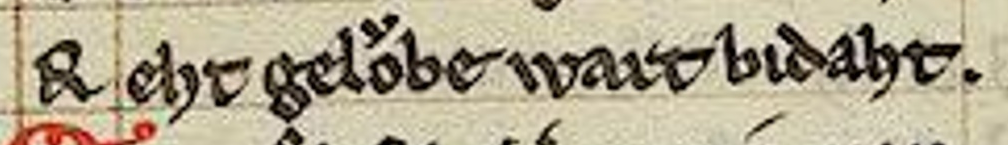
Reht gelo°vbe wart bidaht.
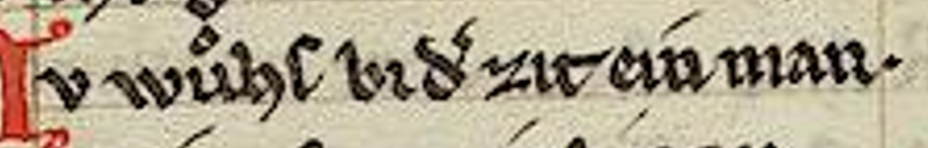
*Nv wu°ohſ bid(er) zit ein man.
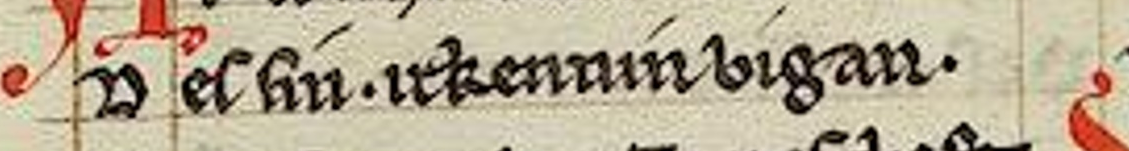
Deſ ſin. irkennin bigan.
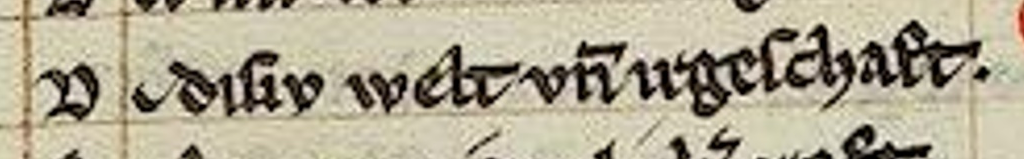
D(az) diſiv welt vn(d) irgeſchaft.
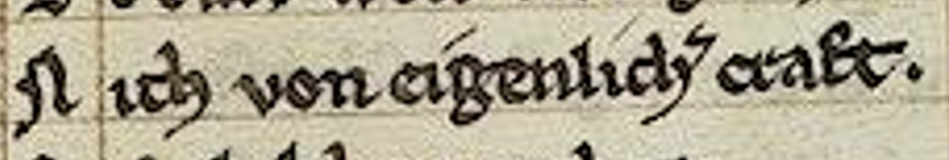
Nich von eigenlich(er) craft.
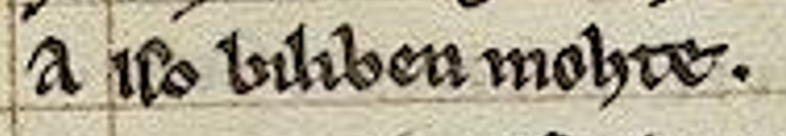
Alſo biliben mohte.
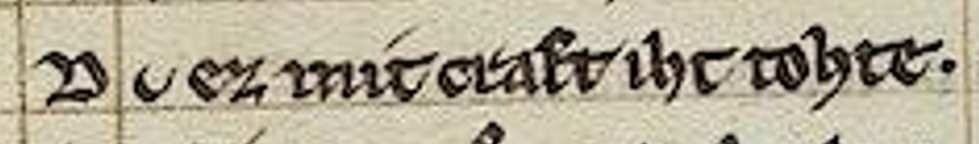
D(az) ez mit craft iht tohte.
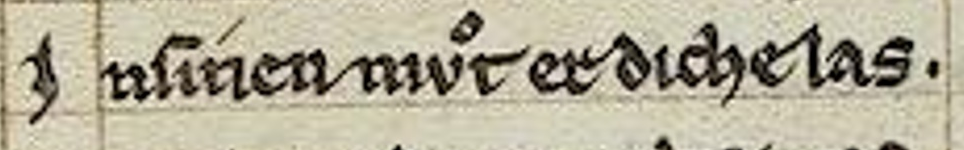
Inſinen mv°ot er diche las.
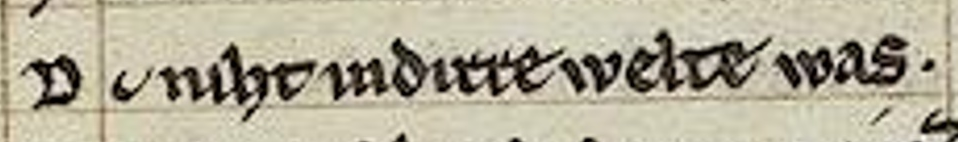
D(az) niht indirre welte was.
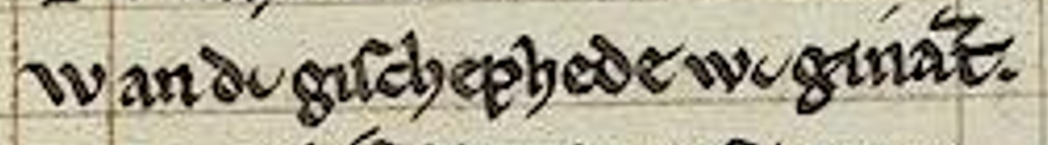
Wan d(az) giſchephede w(az) gina(n)t.
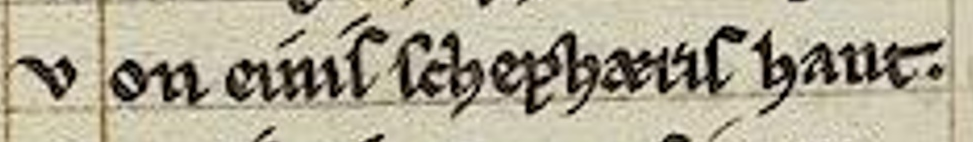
Von einiſ ſcheph[ae]riſ hant.
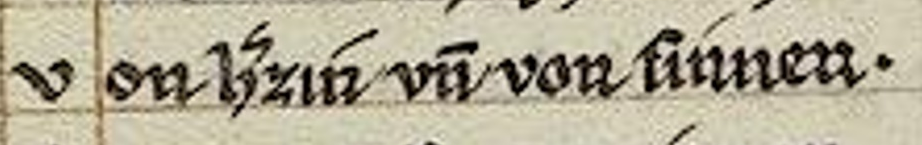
Von h(er)zin vn(d) von ſinnen.
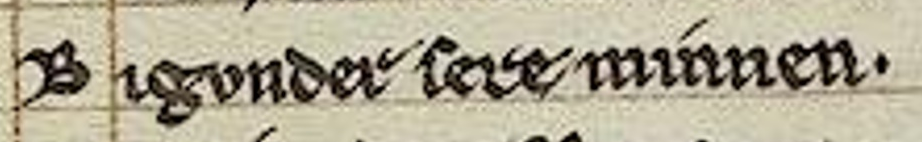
Bigvnder ſere minnen.
